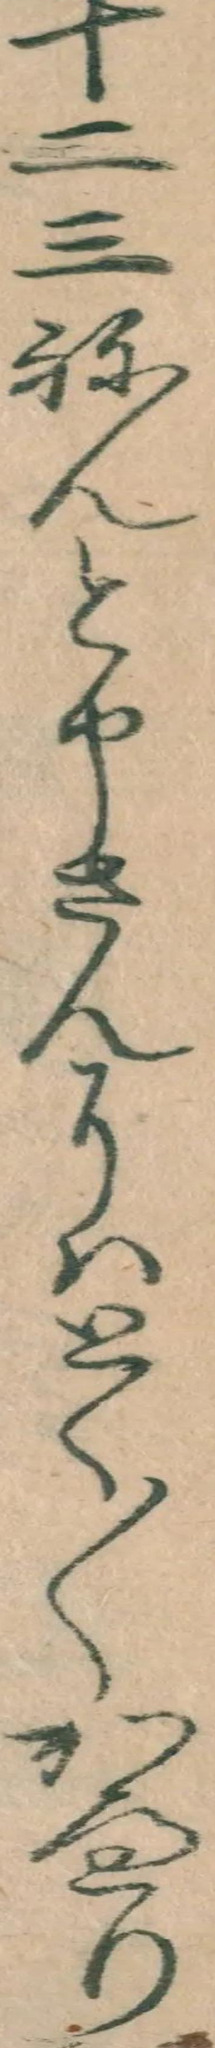十二三ねんと申さんにはとく〳〵かへり
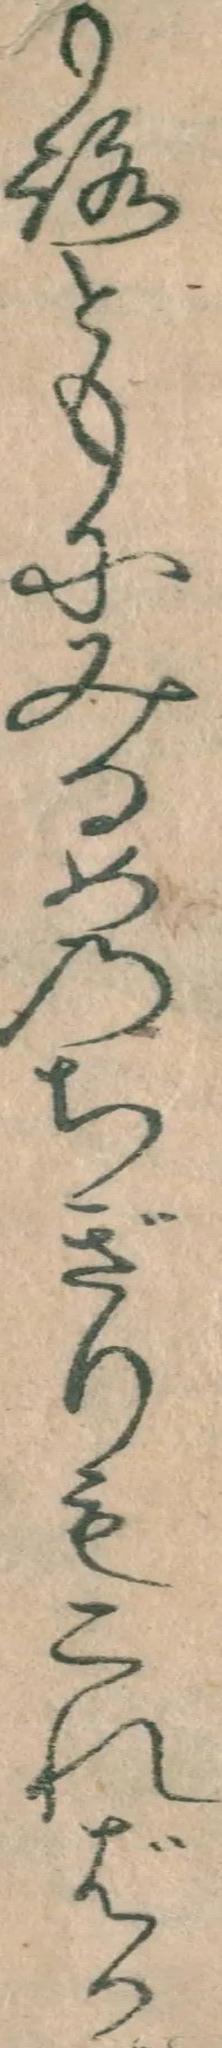もろともにみるめのちぎりもこればか
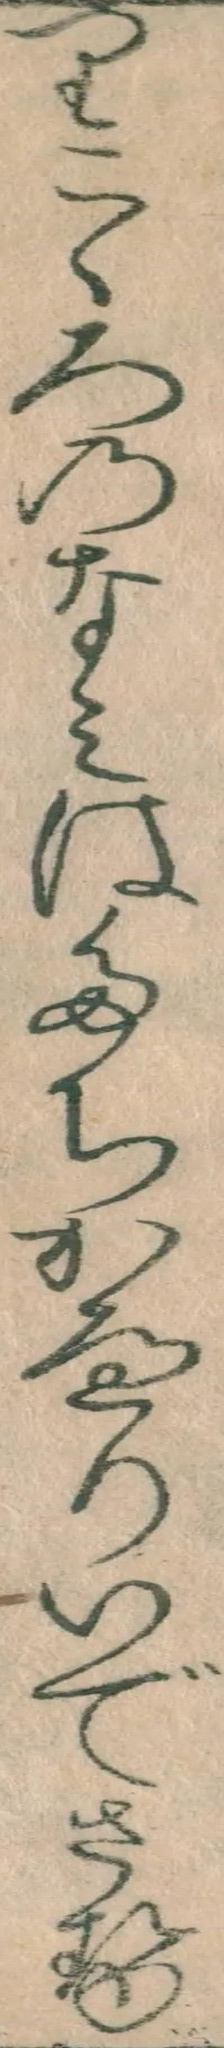りこゝろのなみはたちかへりいでさせ
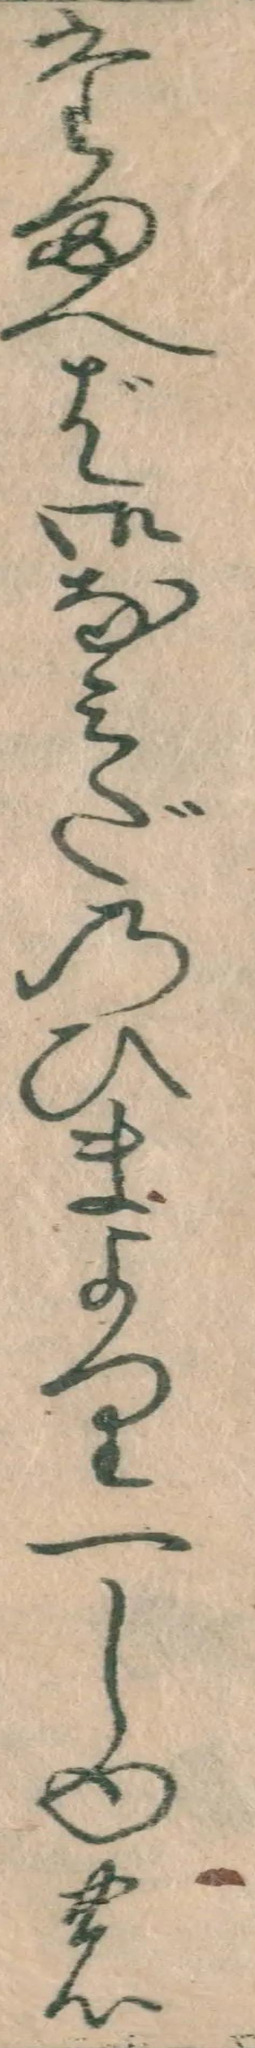たまへば御なみだのひまより一しゆの
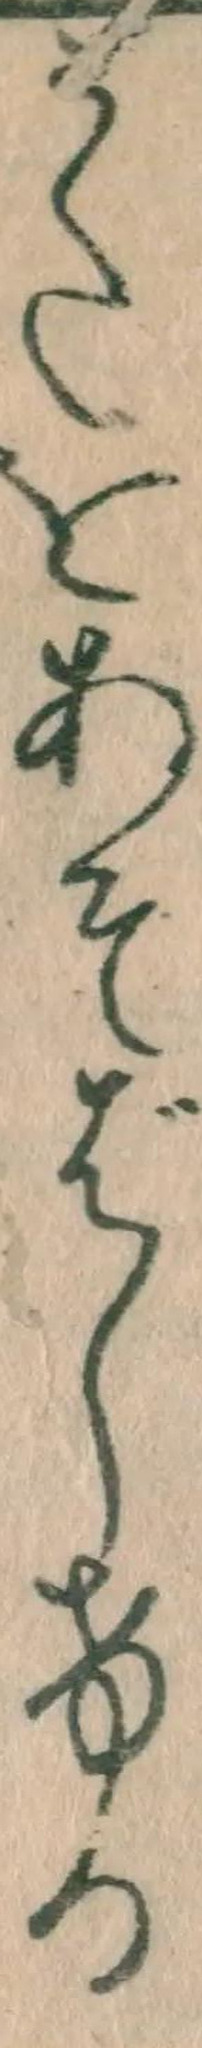かたをあそばしける
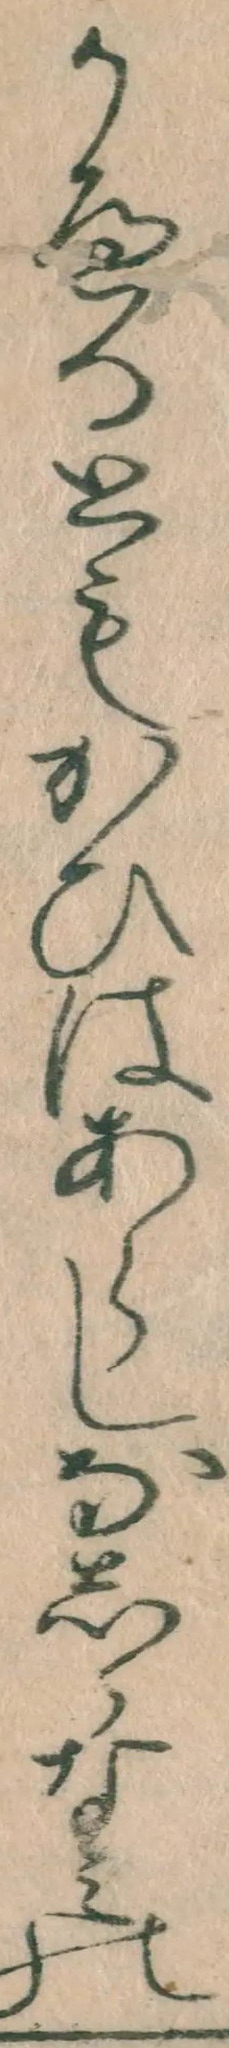かへるともかひはあらしなしらなみの
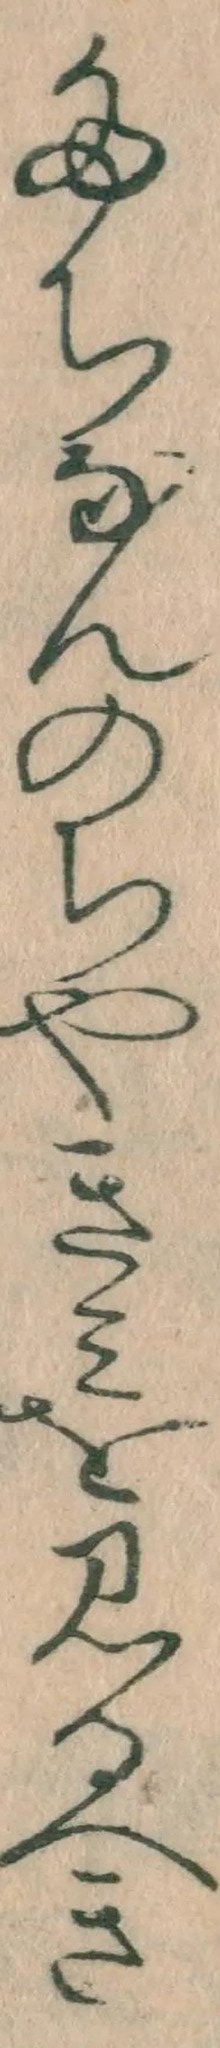たちなんのちやきみを見るへき
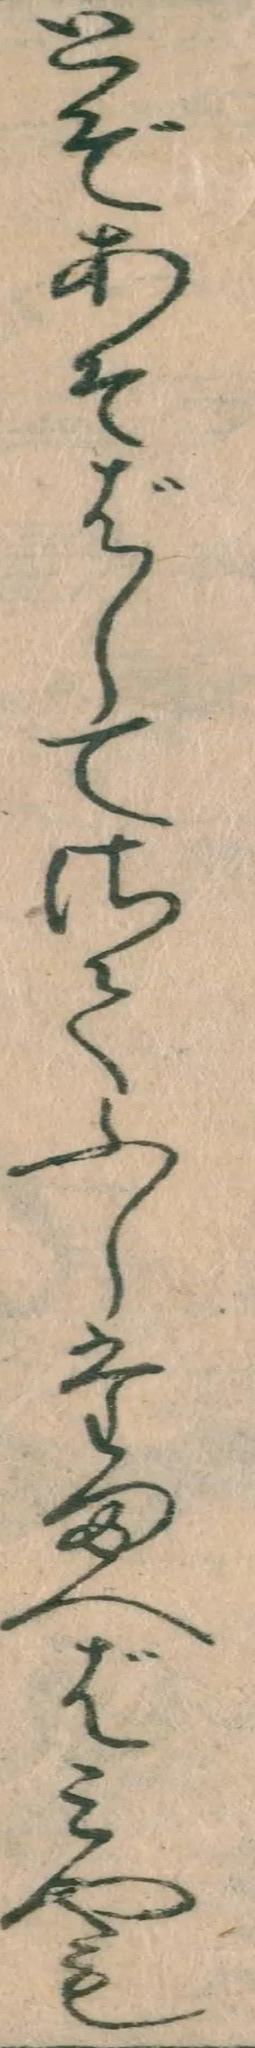とぞあそばしてさてふしたまへばみやも
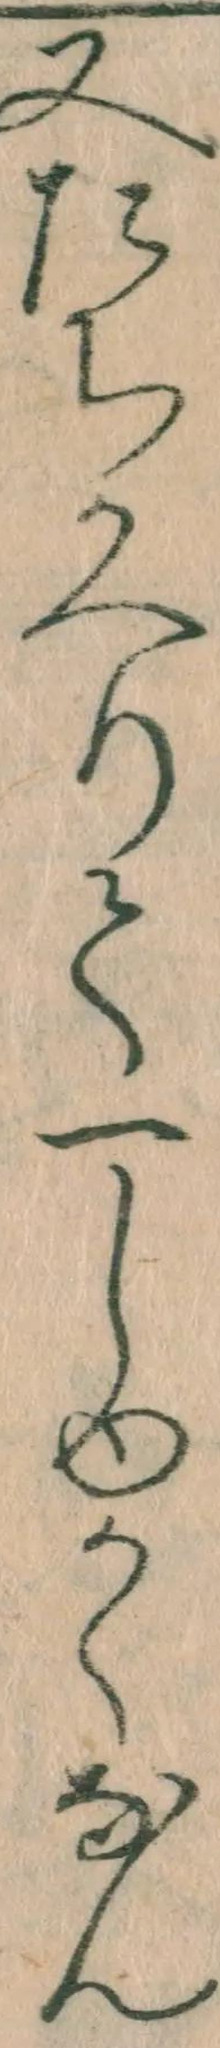又たちかへりて一しゆかくなん
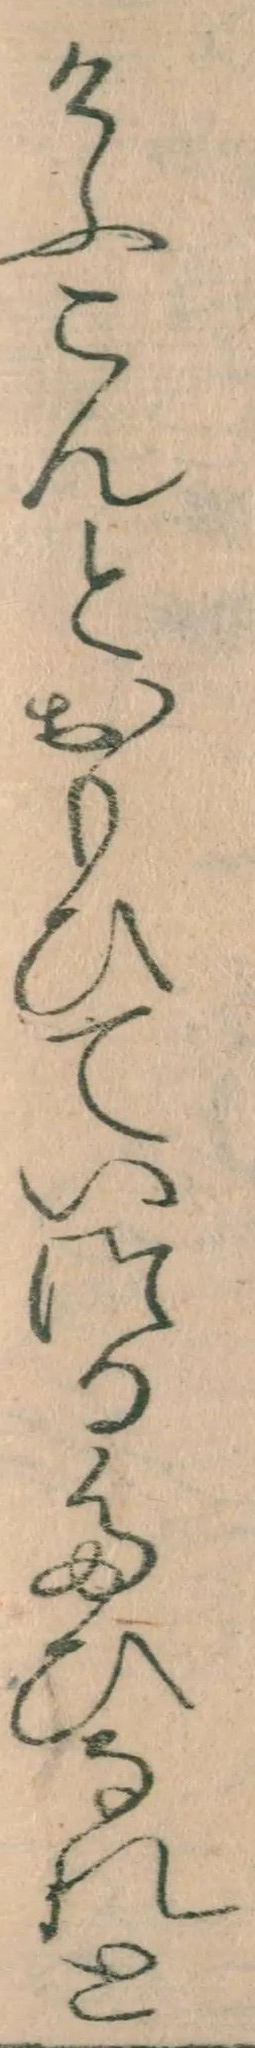けふこんとおもひていつるたひなれと
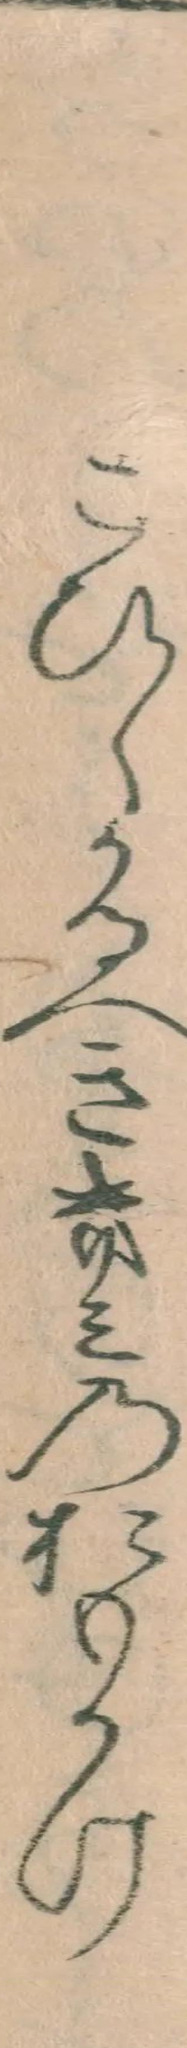こひしかるへきみのおもかけ
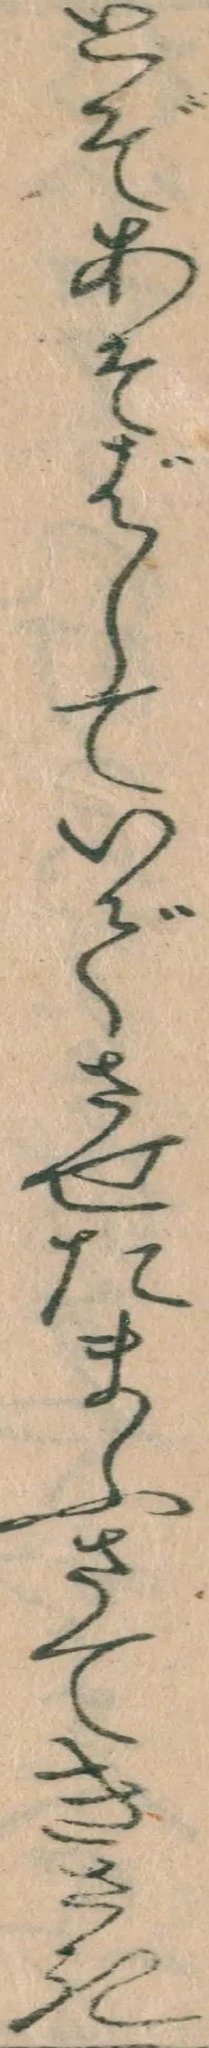とぞあそばしていでさせたまふさてきさき
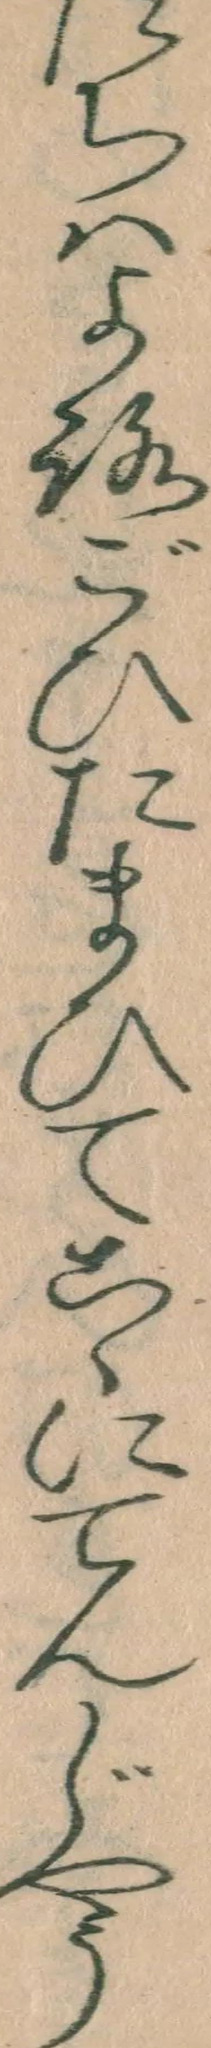たちはよろごひたまひてこゝにてんじやう
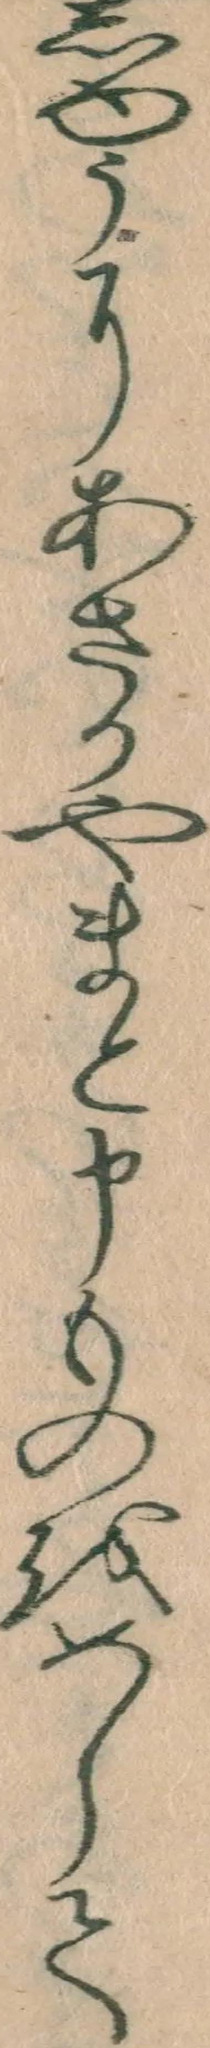しゆうにあさかやまと申ものをめして
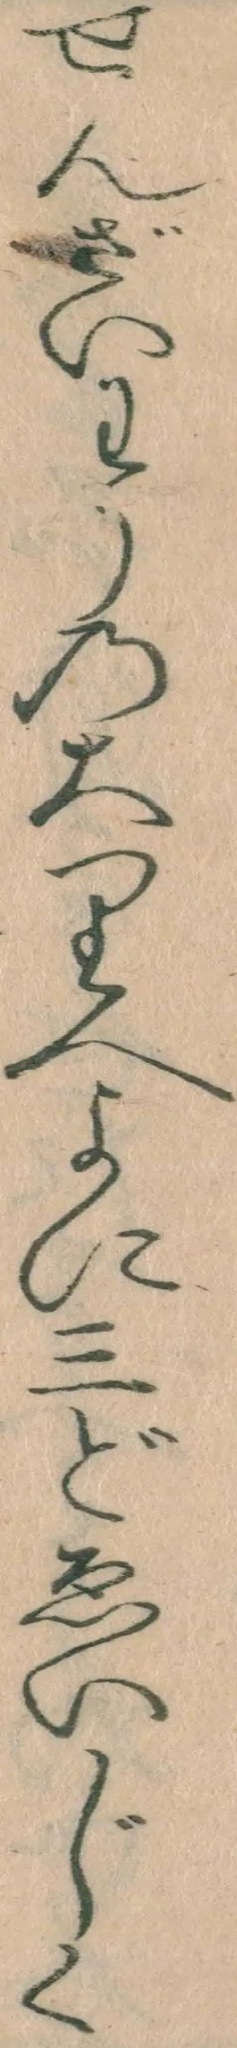せんだいわうの大りへよに三どゑいじく
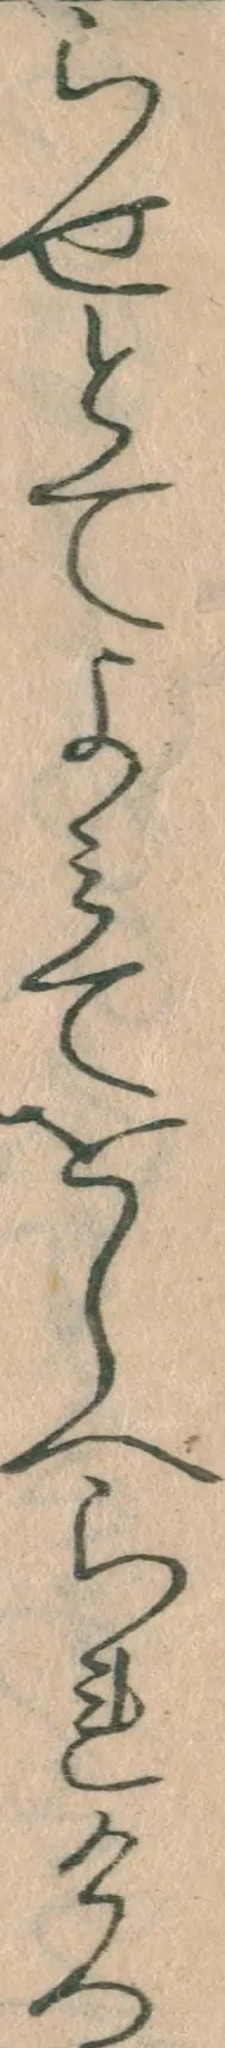らせとてよみてをしへられける
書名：いつくしまの御ほん地 3巻
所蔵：国立国会図書館 National Diet Library, JAPAN
